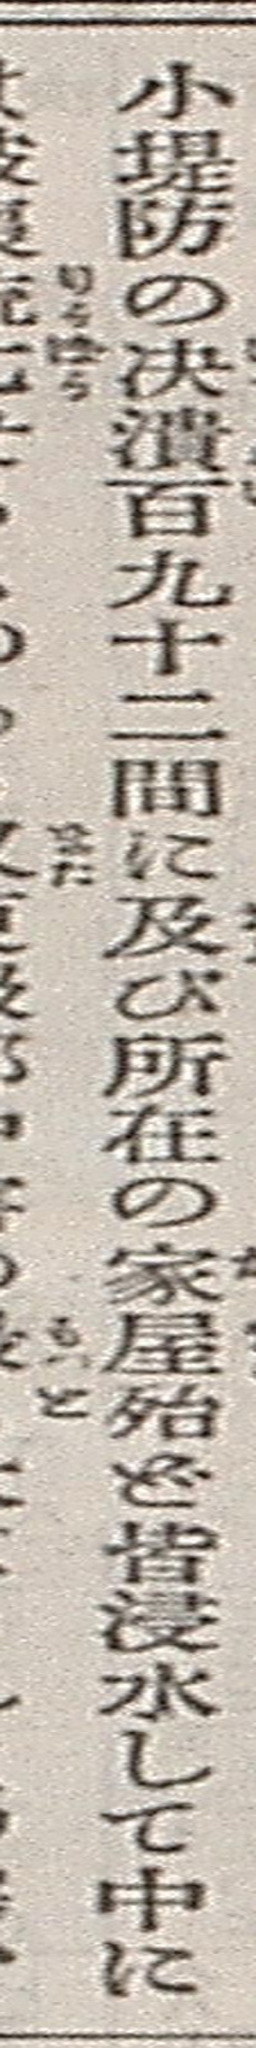小堤防の決潰百九十二間に及び所在の家屋殆ど皆浸水して中に
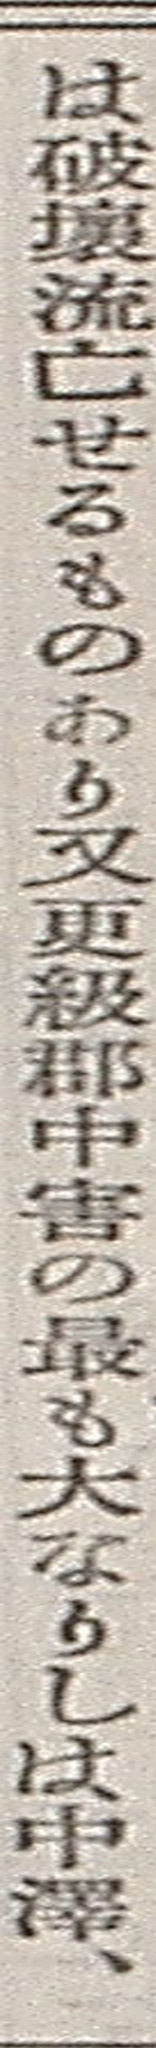は破壊流亡せるものあり又更級郡中害の最も大なりしは中澤、
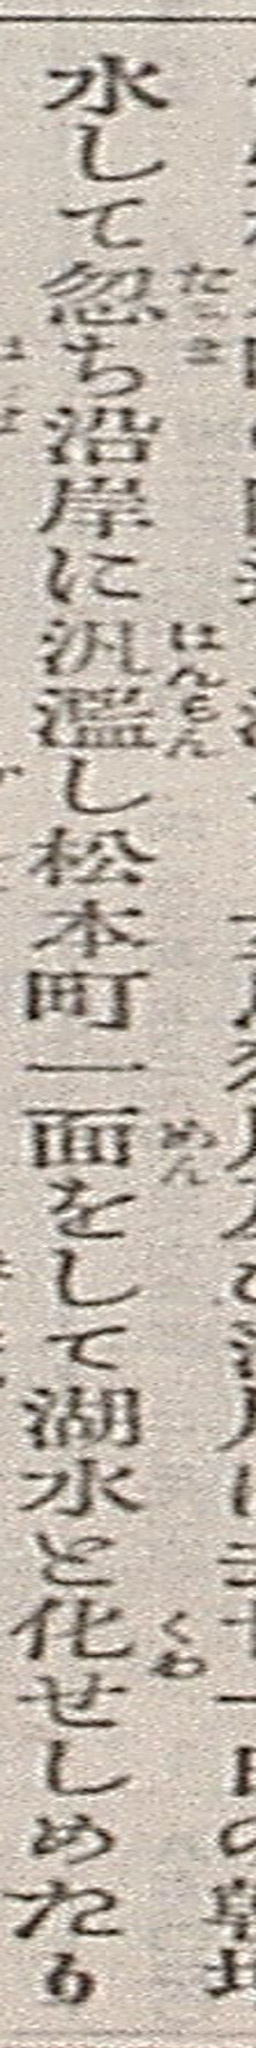水して忽ち沿岸に汎濫し松本町一面をして湖水と化せしめたり
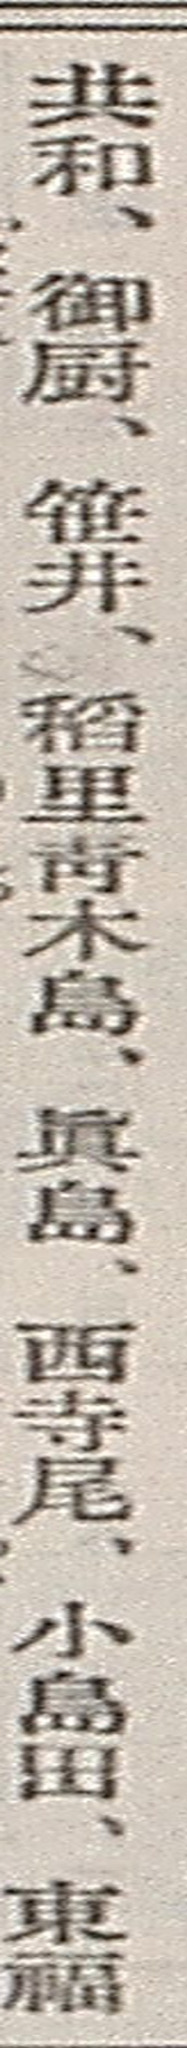共和、御厨、笹井、稲里青木島、真島、西寺尾、小島田、東福
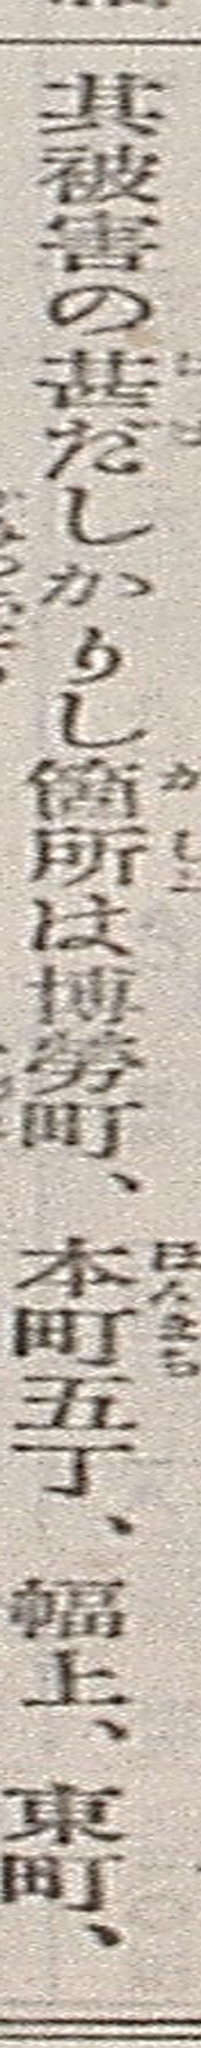其被害の甚だしかりし箇所は博労町、本町五丁、幅上、東町、
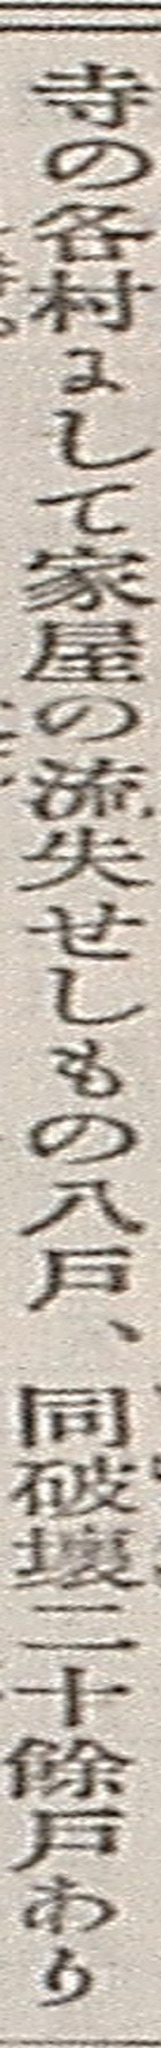寺の各村にして家屋の流失せしもの八戸、同破壊二十餘戸あり
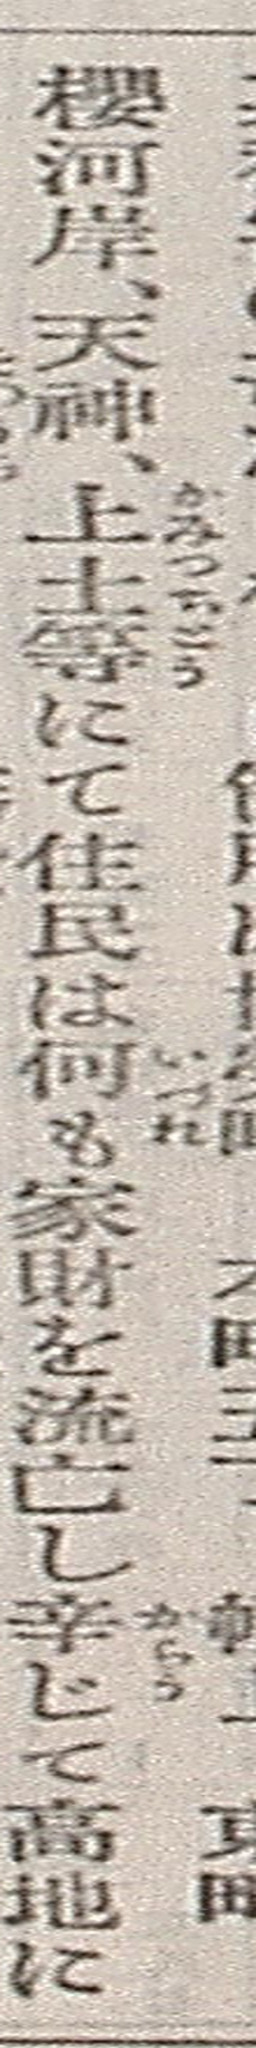櫻河岸、天神、上土等にて住民は何も家財を流亡し辛じて高地に
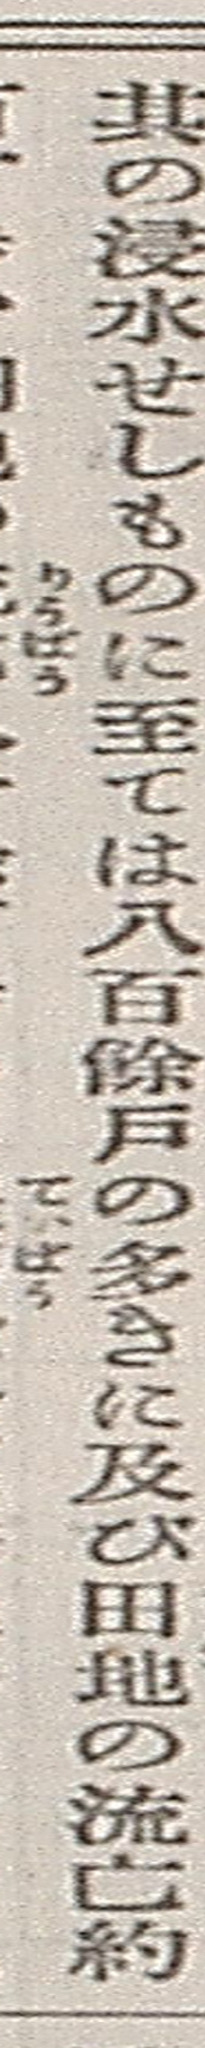其の浸水せしものに至ては八百餘戸のの多きに及び田地の流亡約
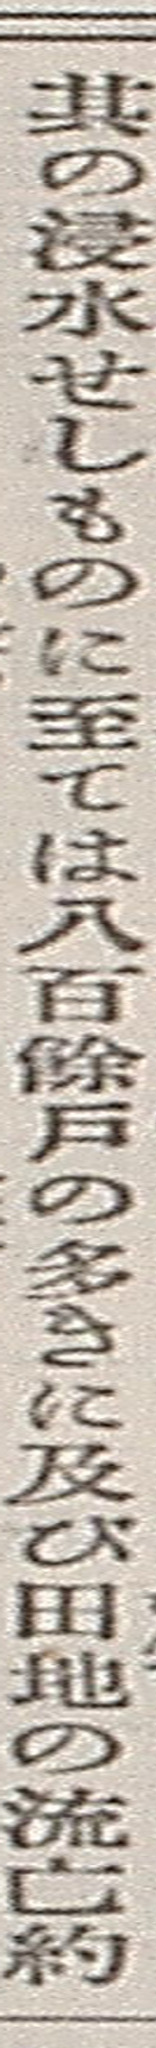其の浸水せしものに至ては八百餘戸のの多きに及び田地の流亡約
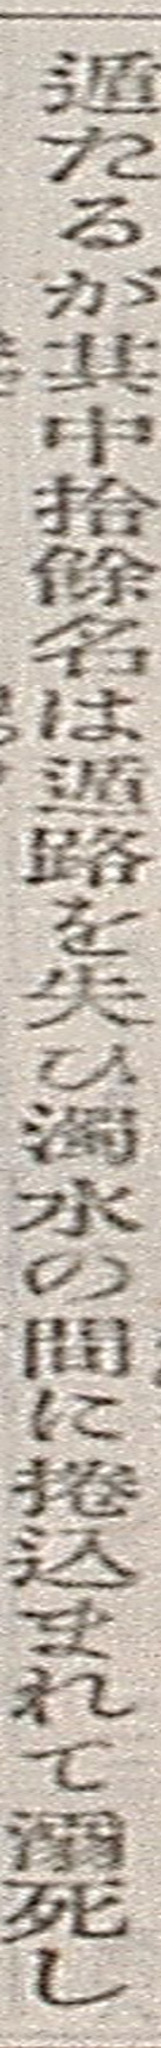遁たるが其中拾餘名は遁路を失ひ濁水の間に捲込まれて溺死し
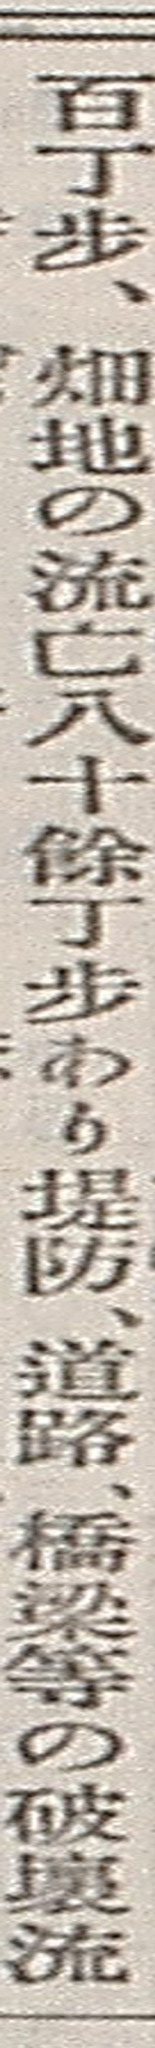百町歩、畑地の流亡八十餘町歩あり堤防、道路、橋梁等の破壊流
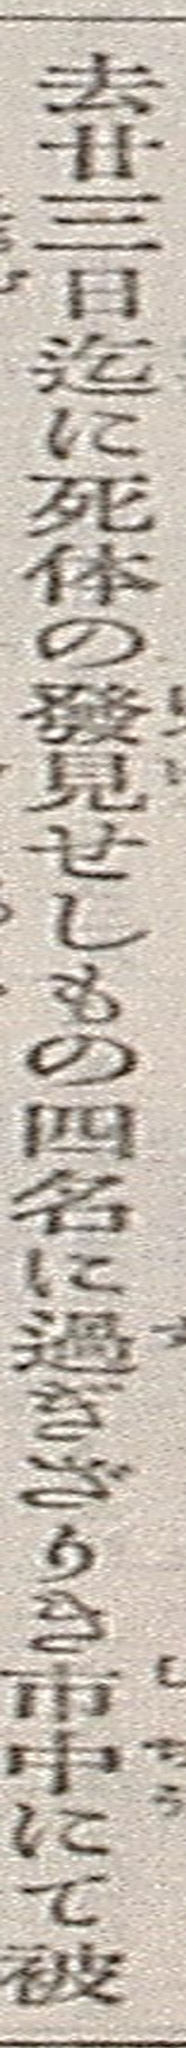去廿三日迄に死体の発見せしもの四名に過ぎざりき市中にて被
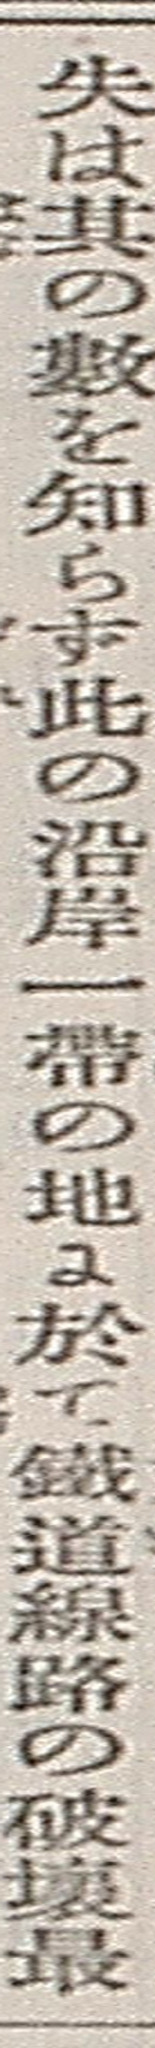失は其の数を知らず此の沿岸一帯の地に於て鉄道線路の破壊最
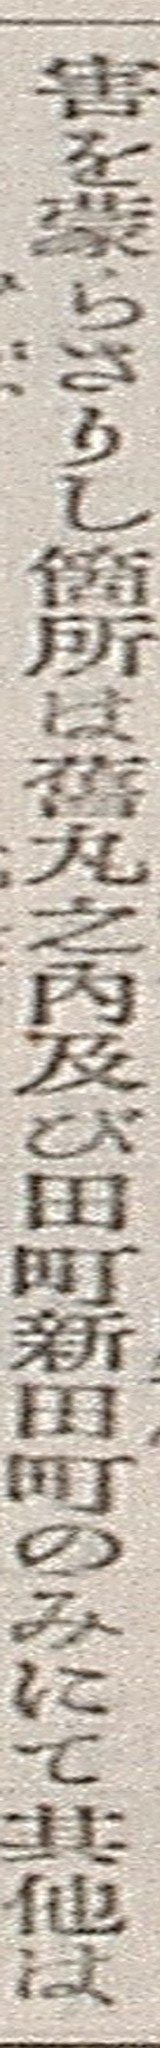害を蒙らさりし箇所は舊丸之内及び田町新田町のみにて其他は
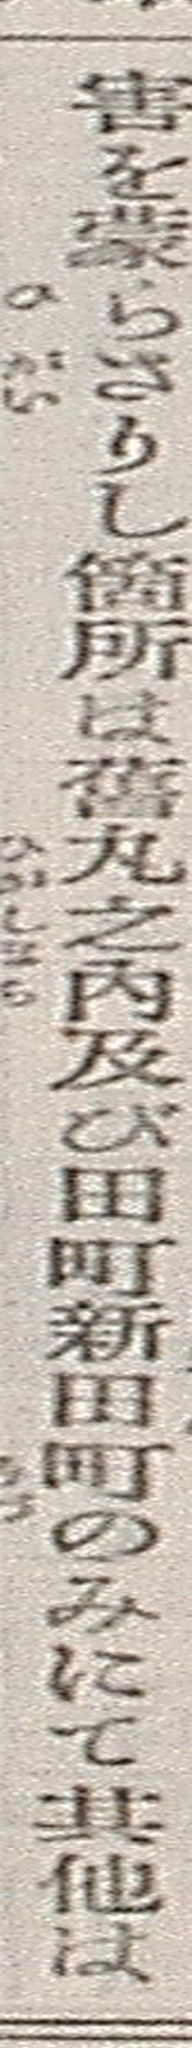害を蒙らさりし箇所は舊丸之内及び田町新田町のみにて其他は
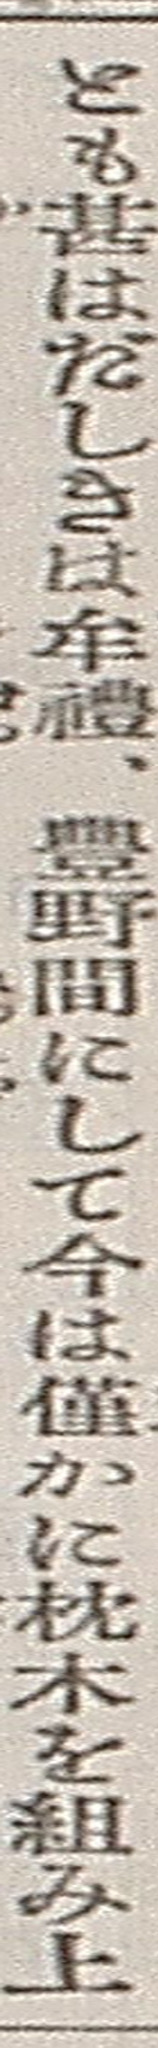とも甚はだしきは牟礼、豊野間にして今は僅かに枕木を組み上
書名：風俗畫報臨時増刊第百二十六號　洪水被害録（中）
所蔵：東京大学地震研究所図書室 Earthquake Research Institute Library, The University of Tokyo, JAPAN
